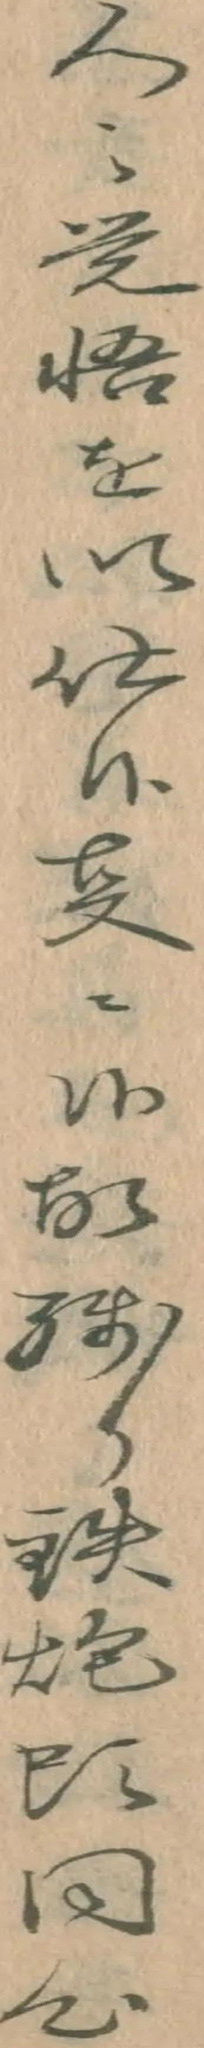人之覚悟を以仕候事に候故残り鉄炮頭同心
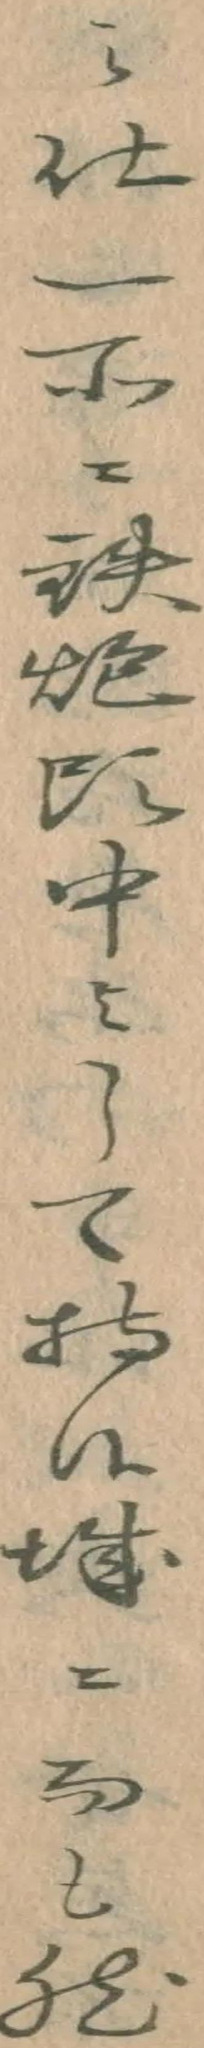之仕一所に鉄炮頭中として持候城に而も然
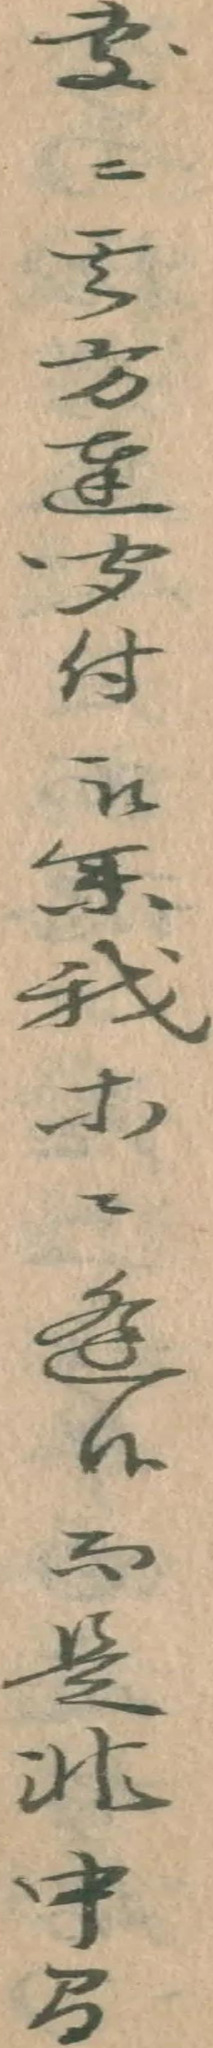処に其方達聞付被参我等に逢候而是非中間
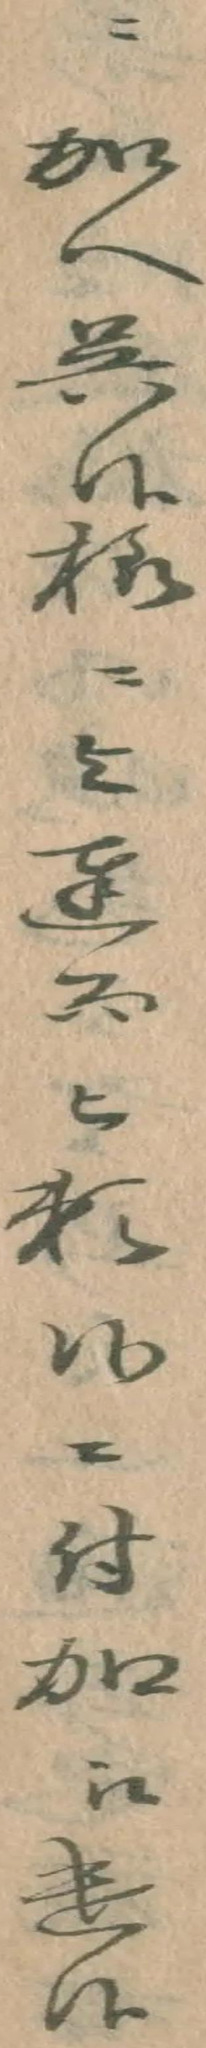に加へ呉候様にと達而被頼候に付加江遣候
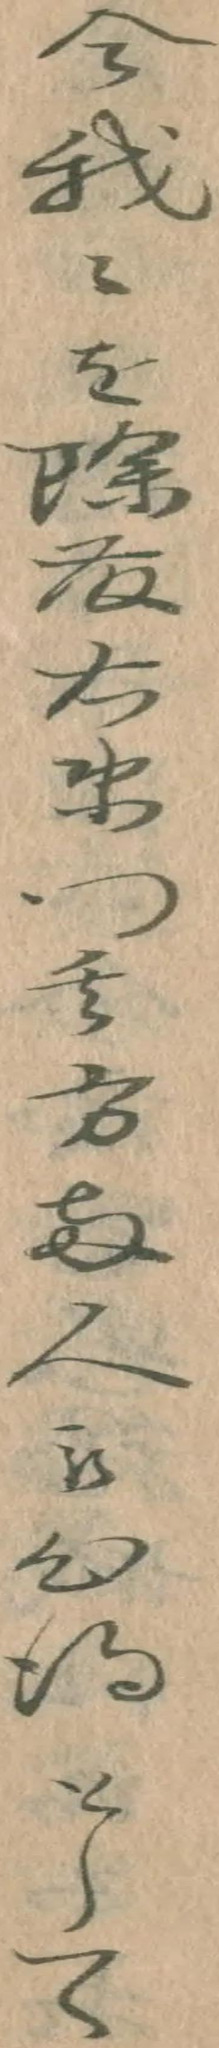今我々を除藤右衛門其方両人被心得として
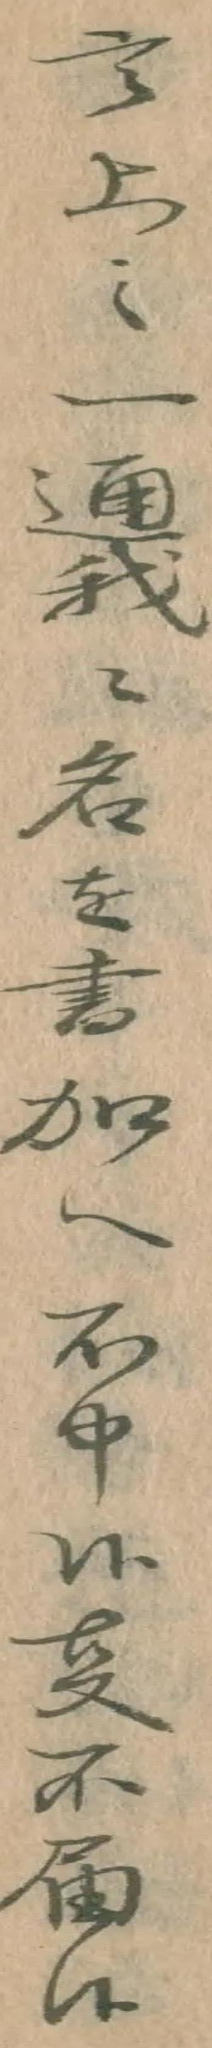言上之一通我に名を書加へ不申候事不届候
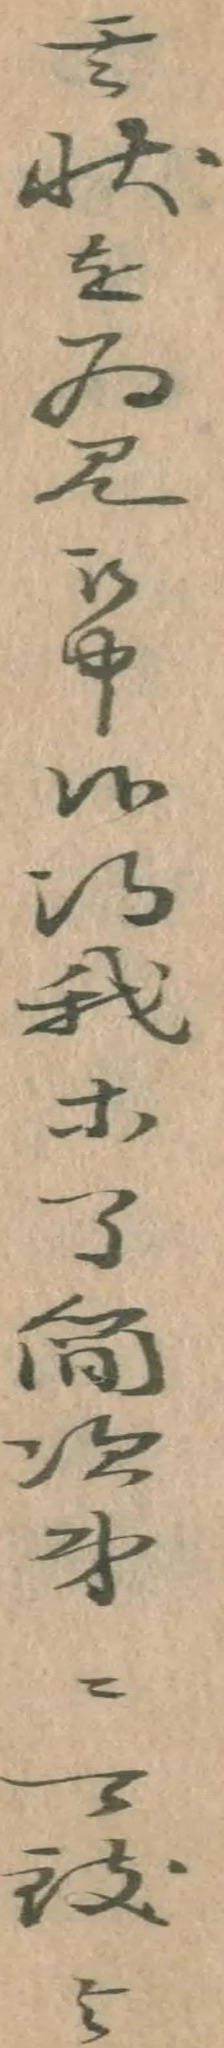其状を為見被申候得我等了簡次第に可致と
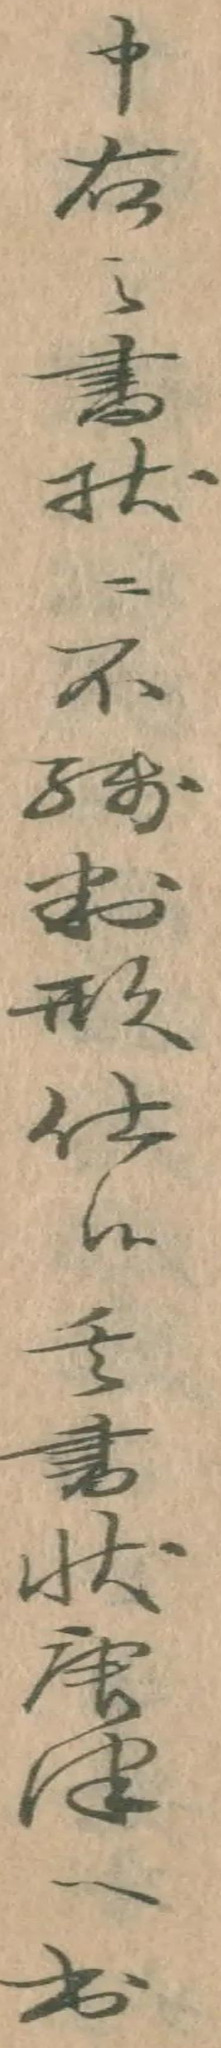申右之書状に不残判形仕候其書状唐津へ出
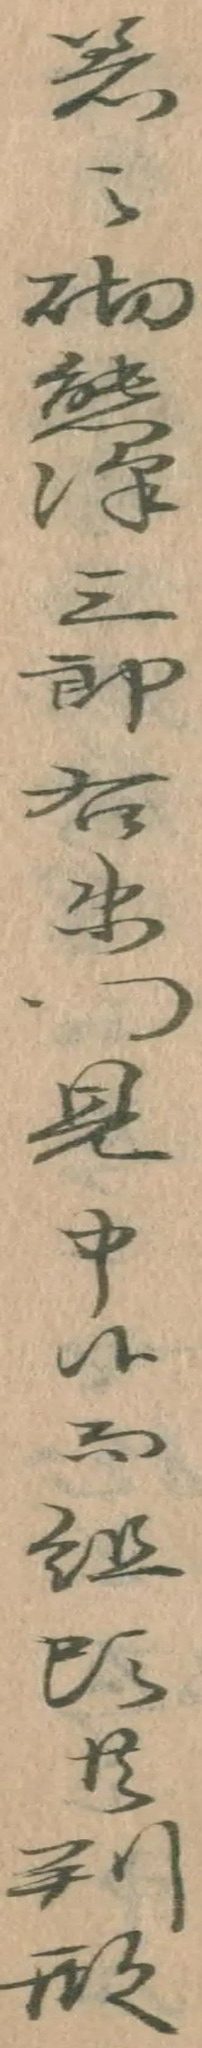着之砌熊沢三郎右衛門見申候而組頭共判形
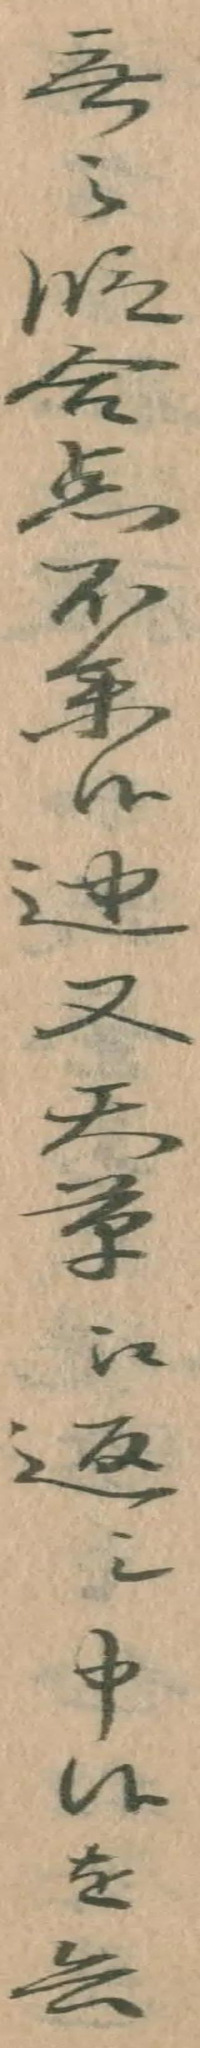無之段合点不参候迚又天草江返し申候を兵
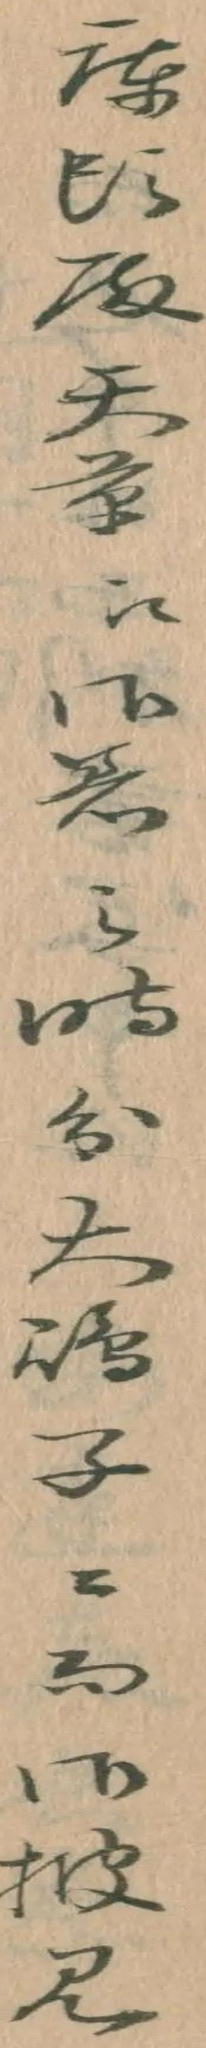庫頭殿天草江御着之時分大島子に而御被見
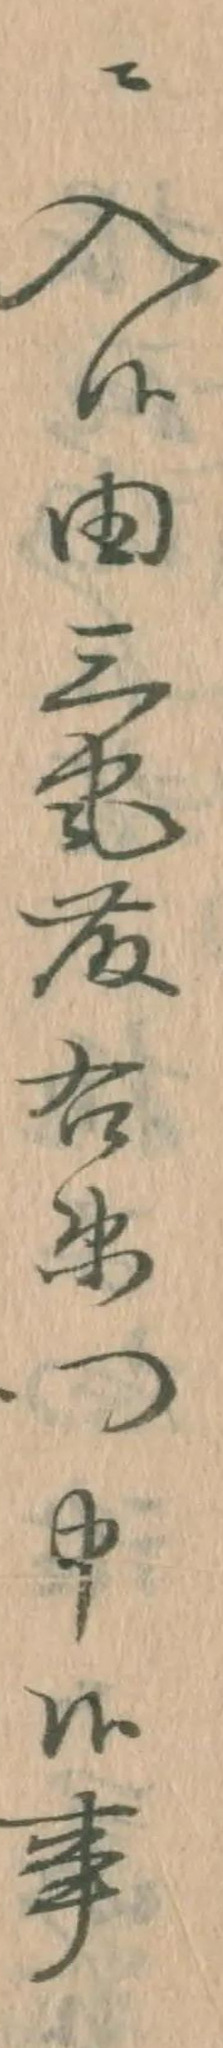に入候由三宅藤右衛門申候事
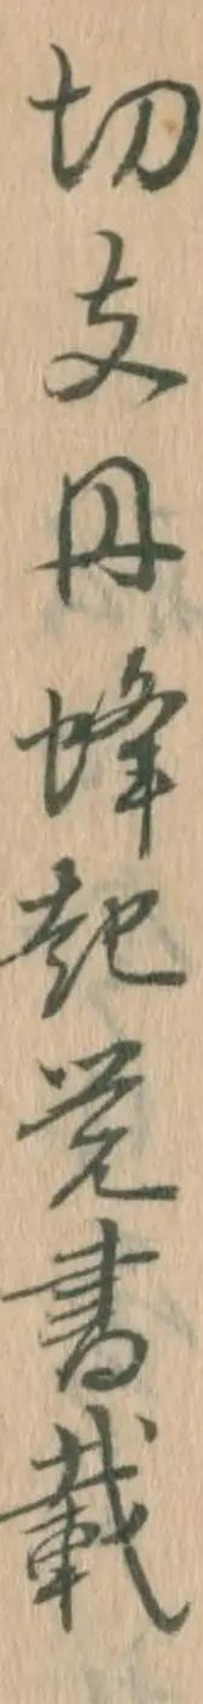切支丹蜂起覚書載
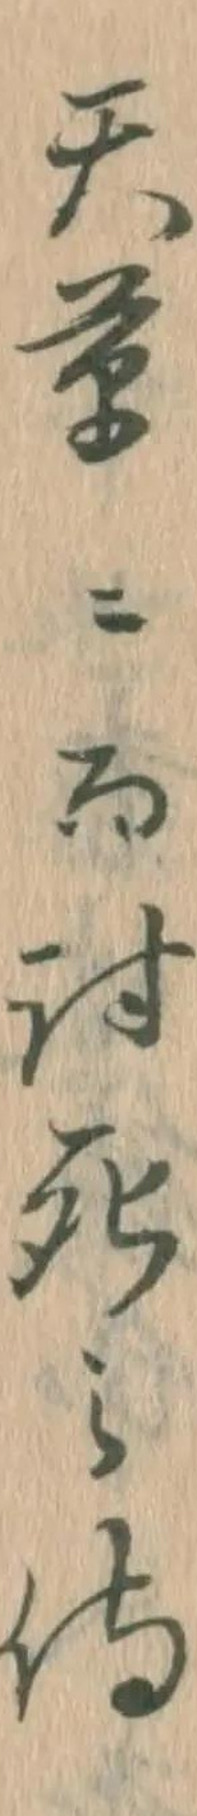天草に而討死之侍
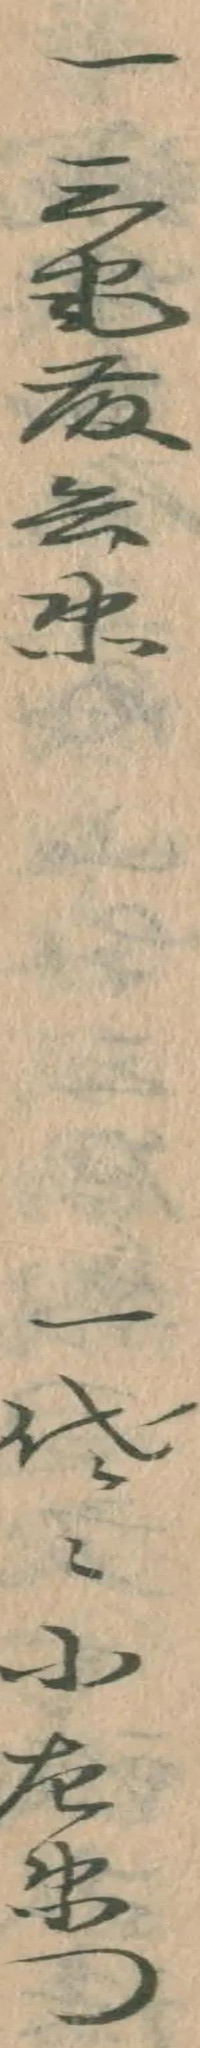一三宅藤兵衛一佐々小左衛門
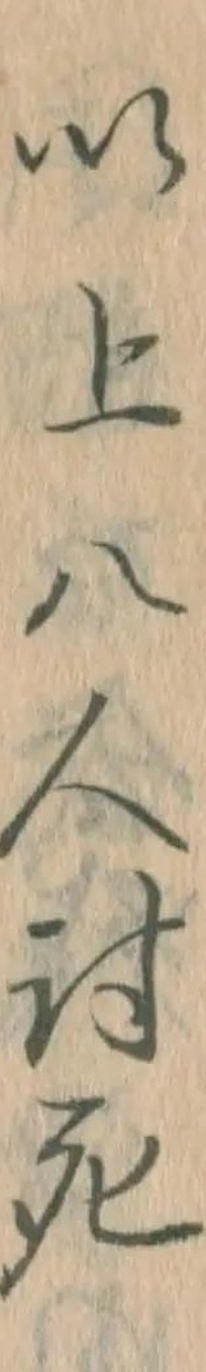以上八人討死
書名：切支丹御退治記 49巻. [3]
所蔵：国立国会図書館 National Diet Library, JAPAN
